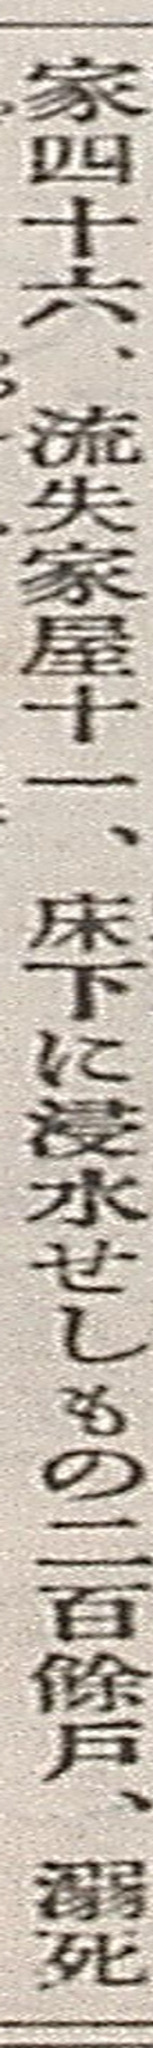家四十六、流失家屋十一、床下に浸水せしもの二百餘戸、溺死
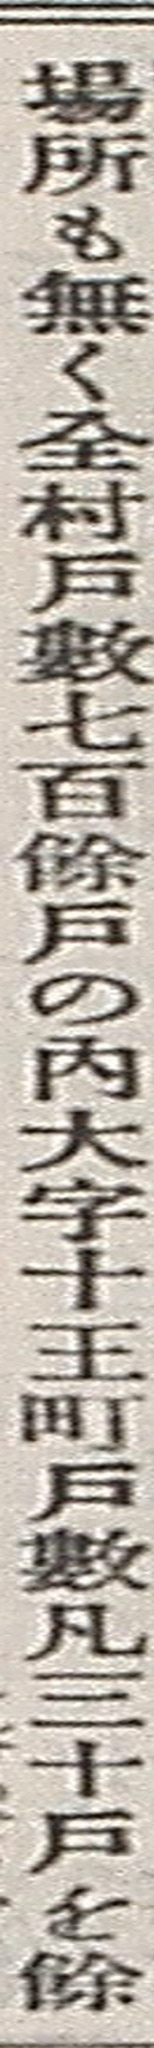場所も無く全村戸数七百餘戸の内大字十王町戸数凡三十戸を餘
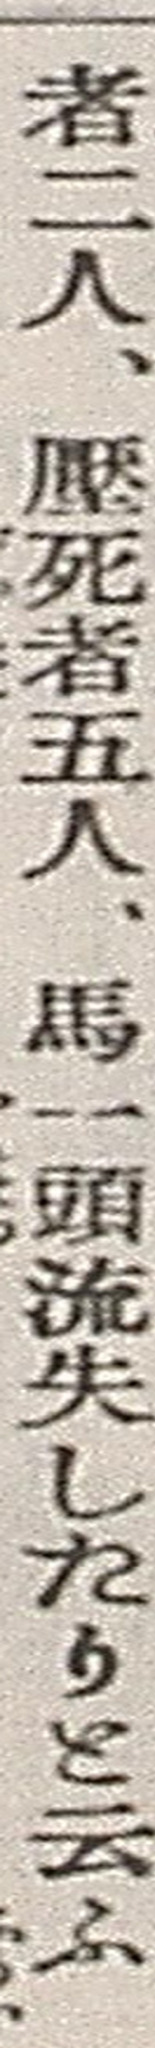者二人、壓死者五人、馬一頭流失したりと云ふ
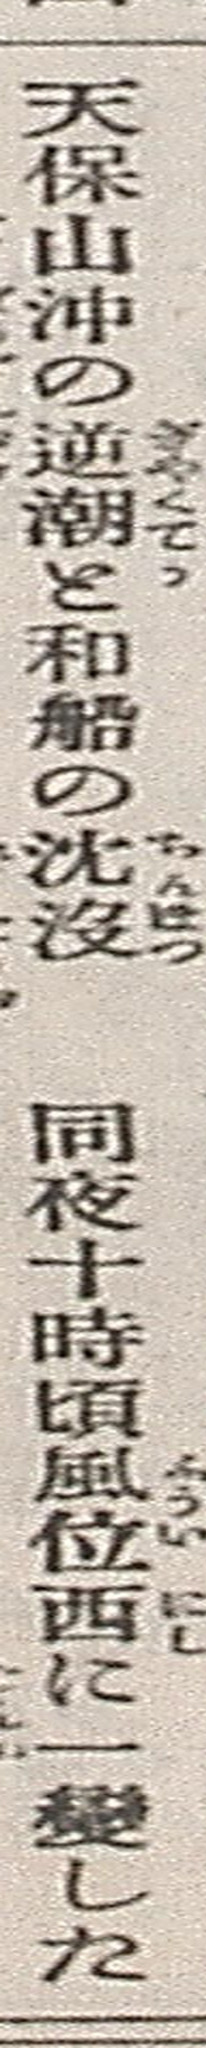天保山沖の逆潮と和船の沈没同夜十時頃風位西に一変した
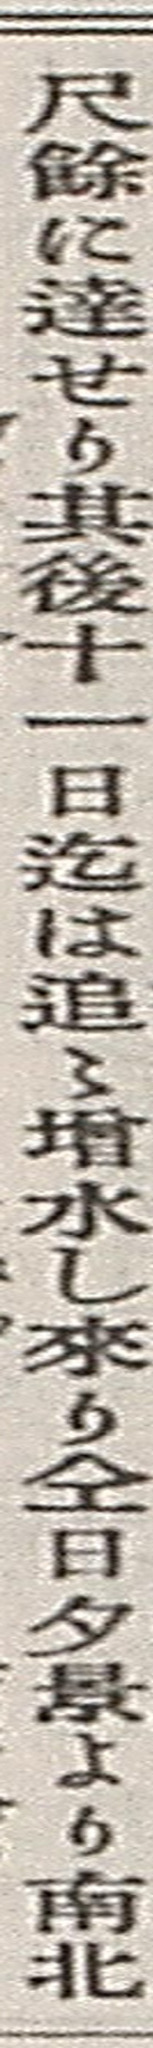尺餘に達せり其後十一日迄は追々増水し来り同日夕景より南北
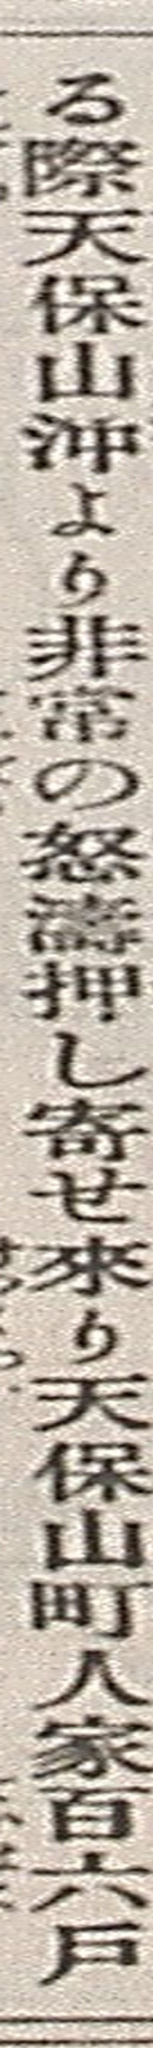る際天保山沖より非常の怒濤押し寄せ来り天保山町人家百六戸
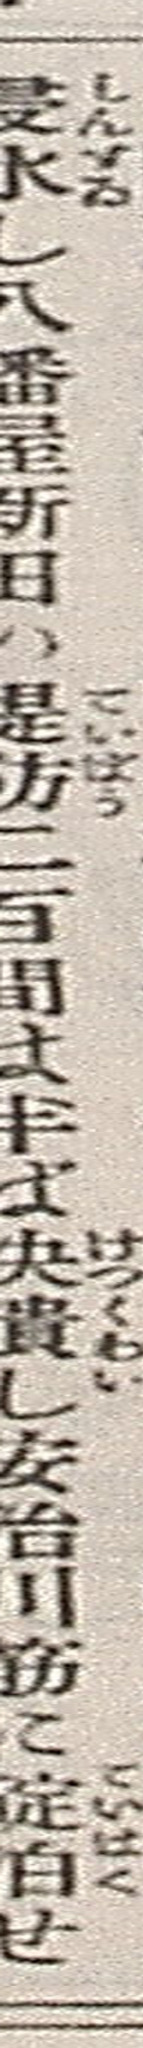浸水し八幡屋新田の堤防二百間は半ば決潰し安治川筋に碇泊せ
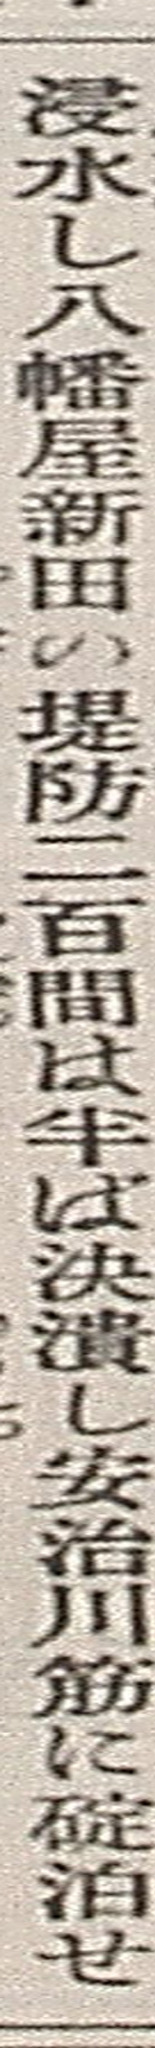浸水し八幡屋新田の堤防二百間は半ば決潰し安治川筋に碇泊せ
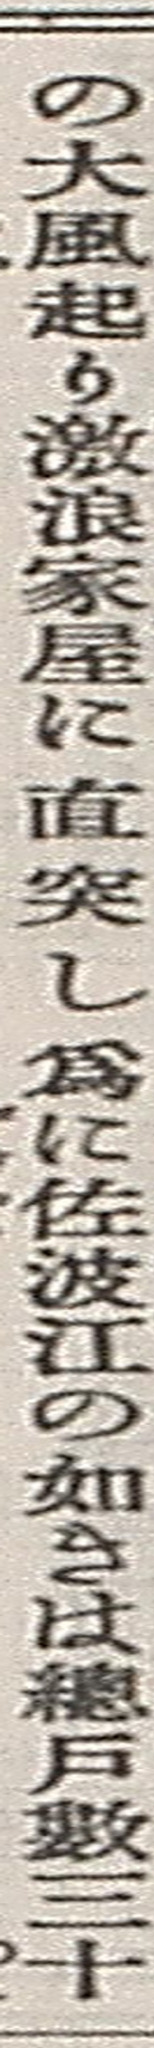の大風起り激浪家屋に直突し為に佐破江の如きは総戸数三十
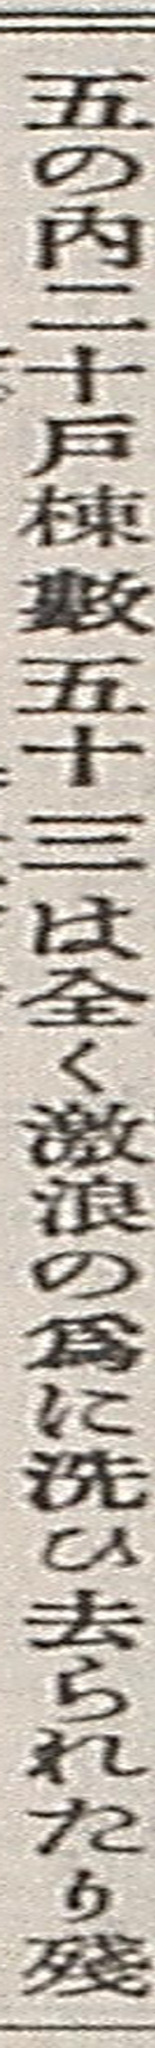五戸の内二十戸棟数五十三は全く激浪の為に洗ひ去られたり残
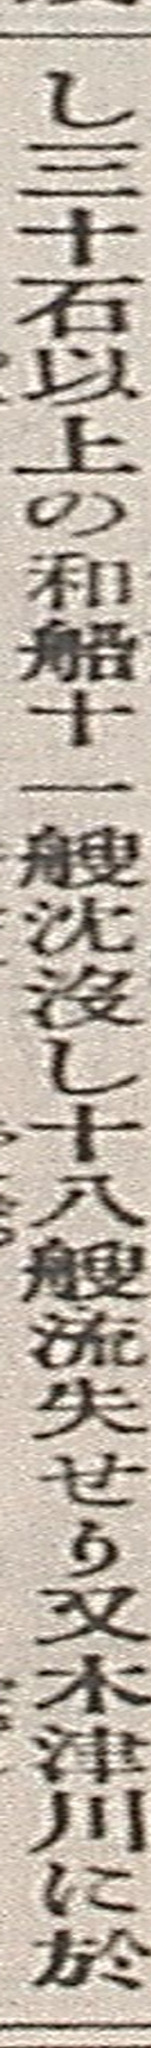し三十石以上の和船十一艘沈没し十八艘流失せり又木津川に於
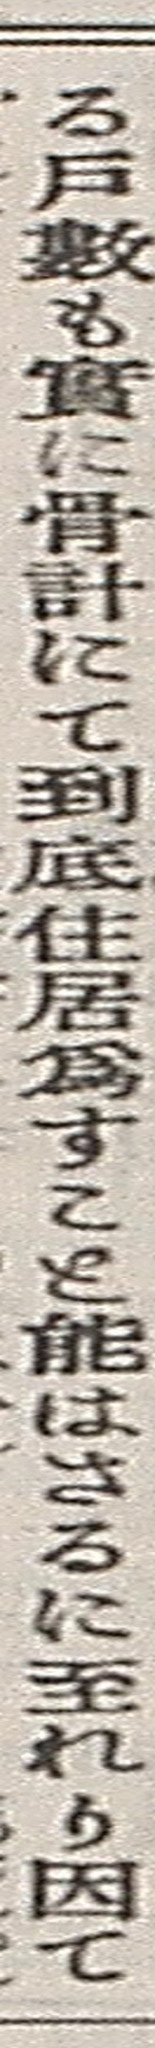る戸数も実に骨計にて到底住居為すこと能はさるに至れり因て
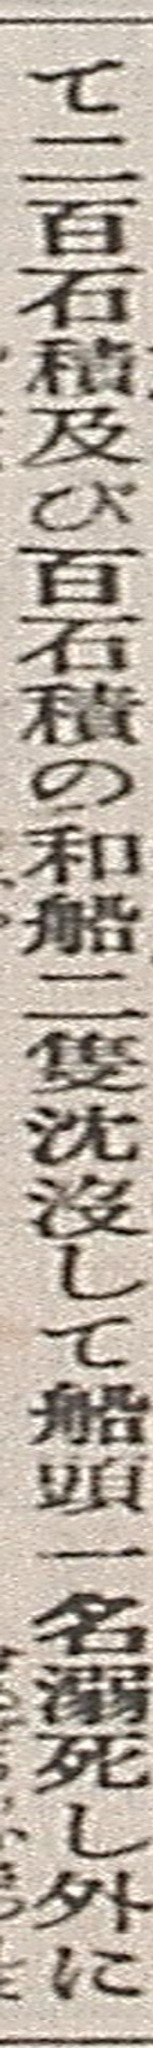て二百石積及び百石積の和船二隻沈没して船頭一名溺死し外に
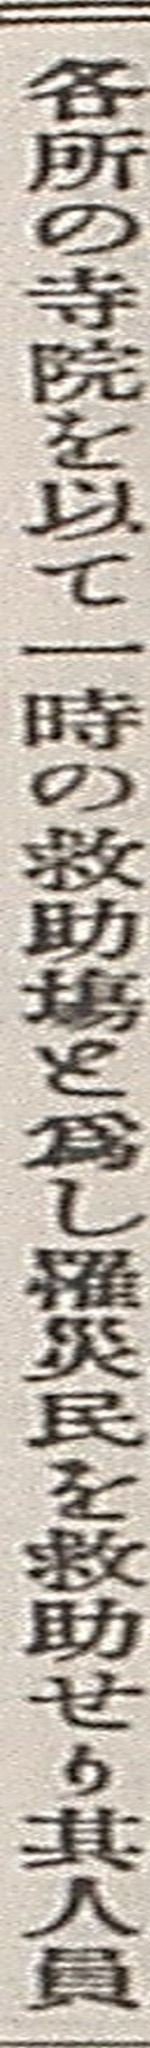各所の寺院を以て一時の救助場と為し罹災民を救助せり其人員
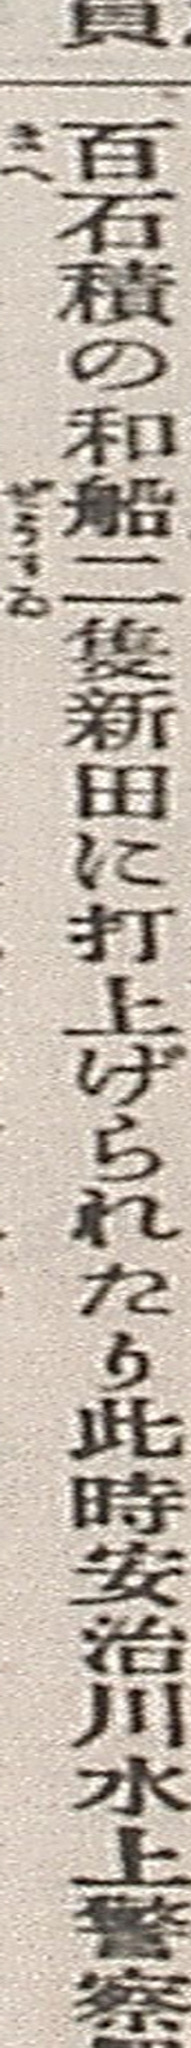百石積の和船二隻新田に打上げられたり此時安治川水上警察署
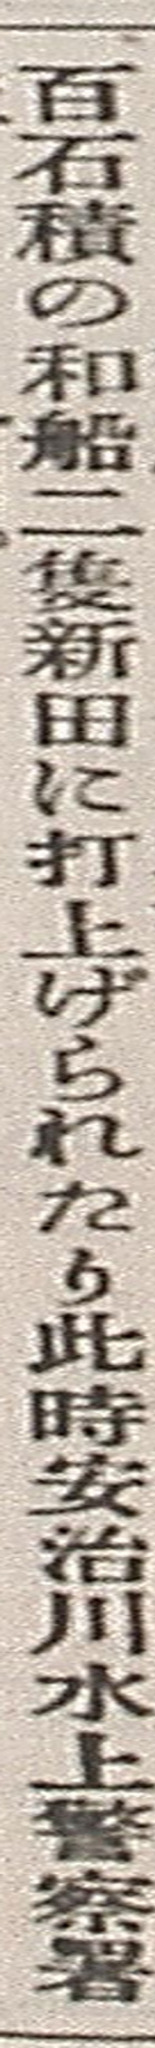百石積の和船二隻新田に打上げられたり此時安治川水上警察署
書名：風俗畫報臨時増刊第百二十八號　洪水被害録（下）
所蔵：東京大学地震研究所図書室 Earthquake Research Institute Library, The University of Tokyo, JAPAN
